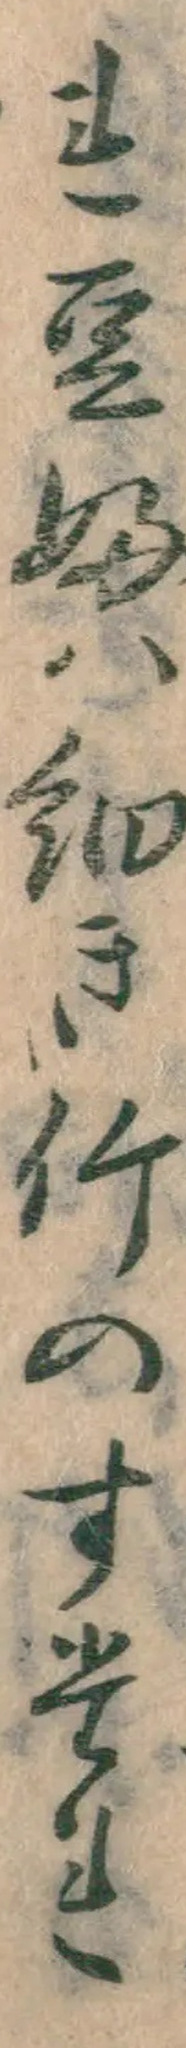れ豆ふは細き竹のすたれ
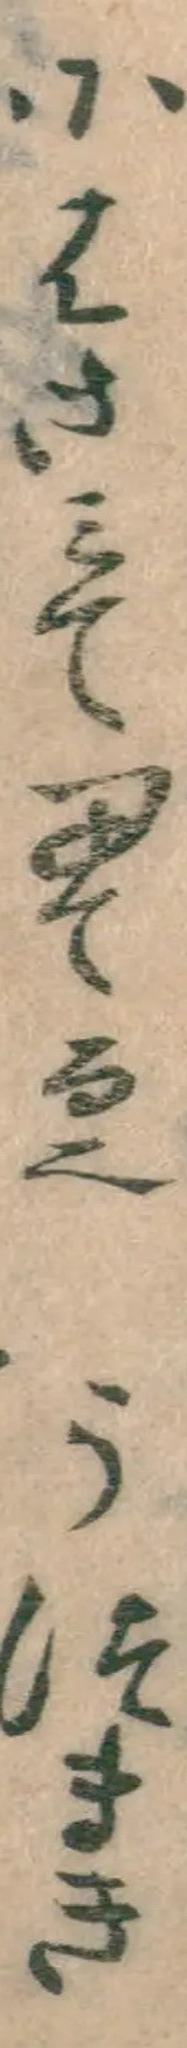にはさみてゆてる也うつまき
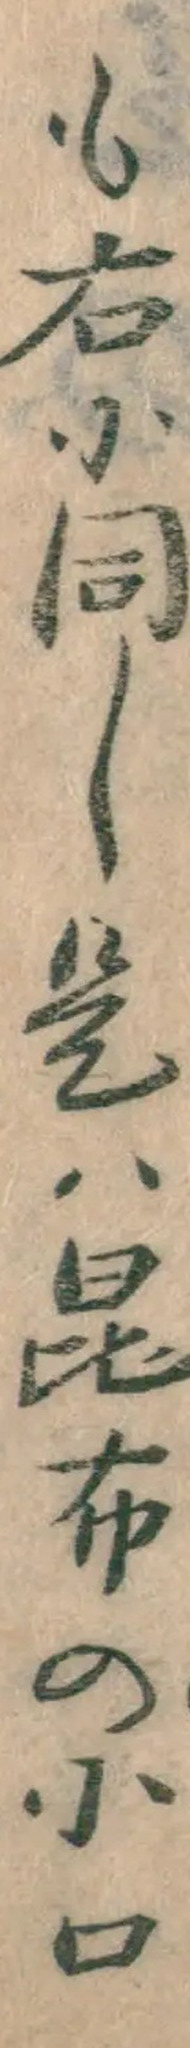も右に同し是は昆布の小口
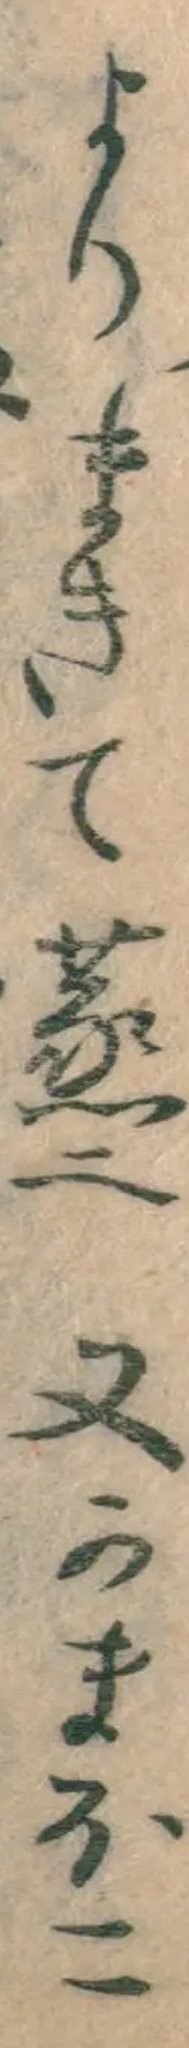よりまきて蒸なり又かまほこ
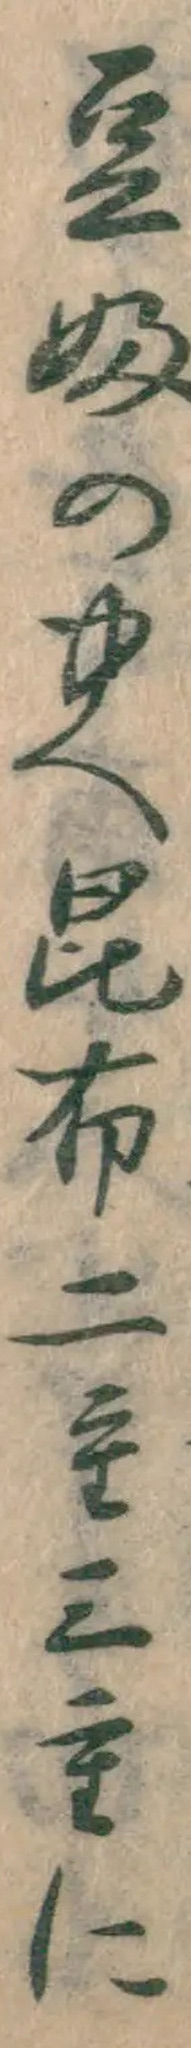豆ふの中へ昆布二重三重に

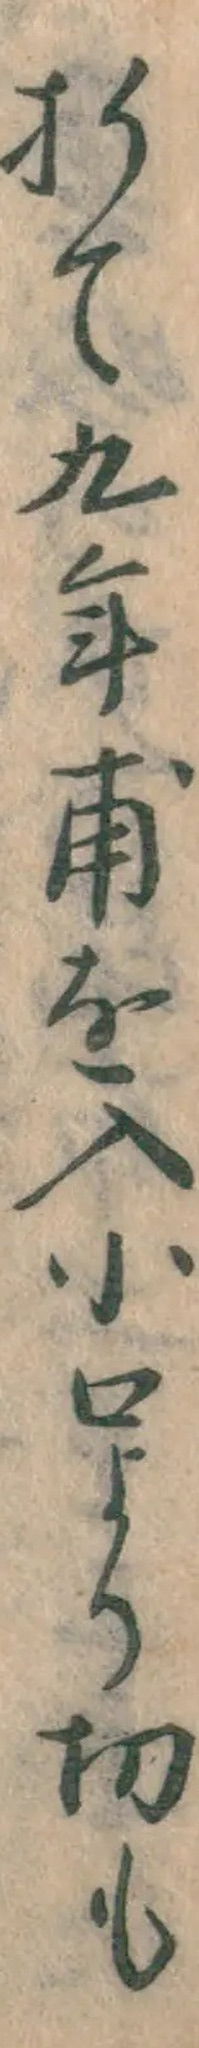折て九年甫を入小口より切も
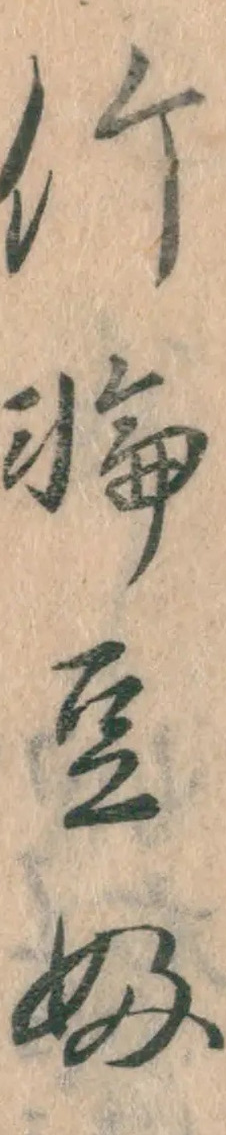竹輪豆ふ
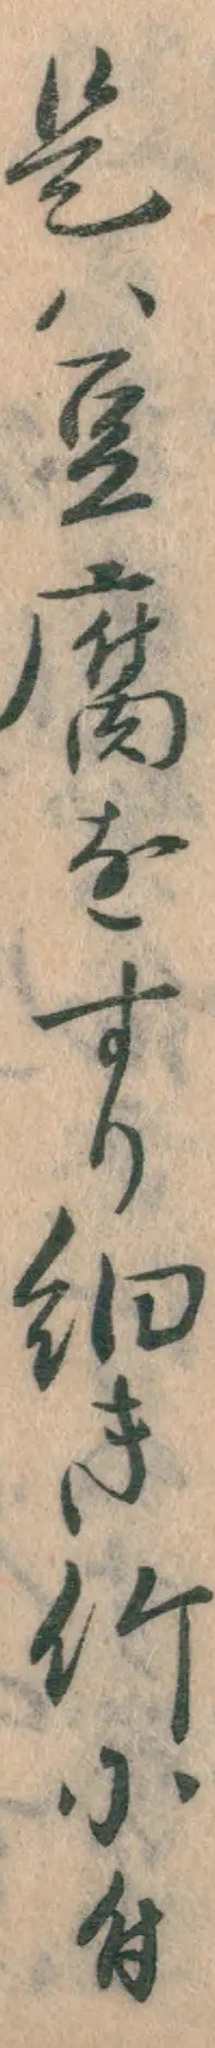是は豆腐をすり細き竹に付
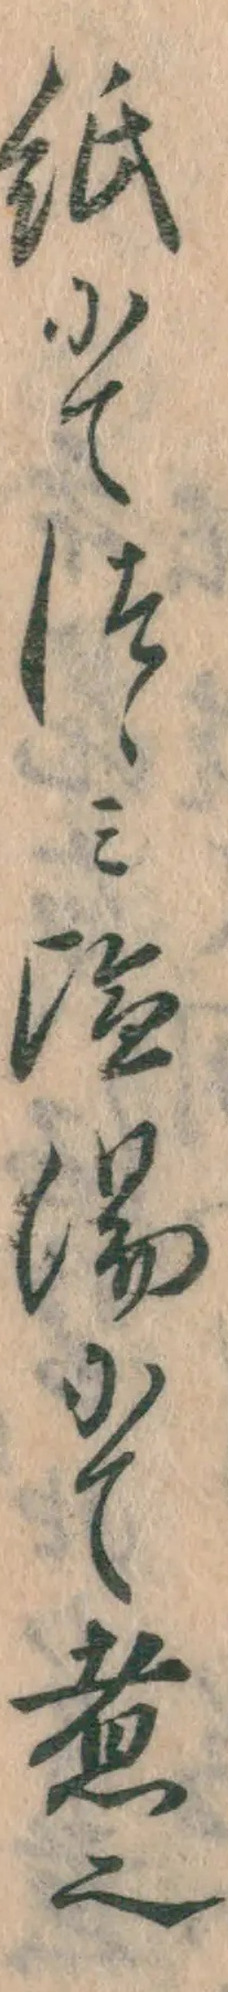紙にてつゝみ塩湯にて煮也
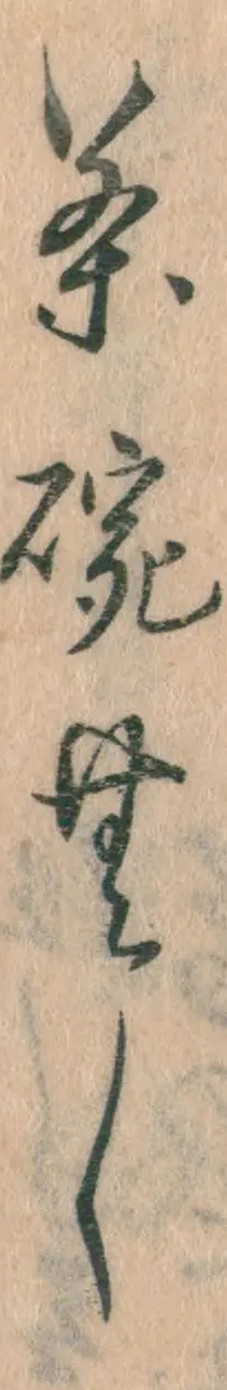茶碗むし
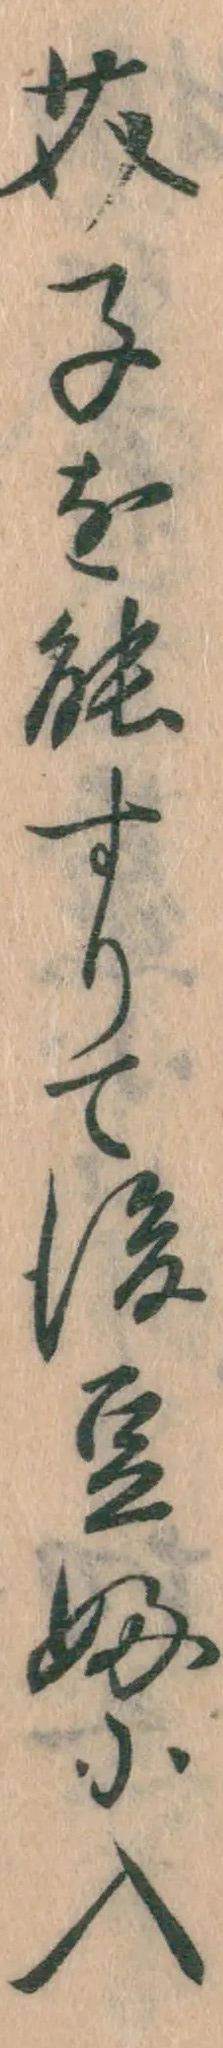芥子を能すりて後豆ふに入
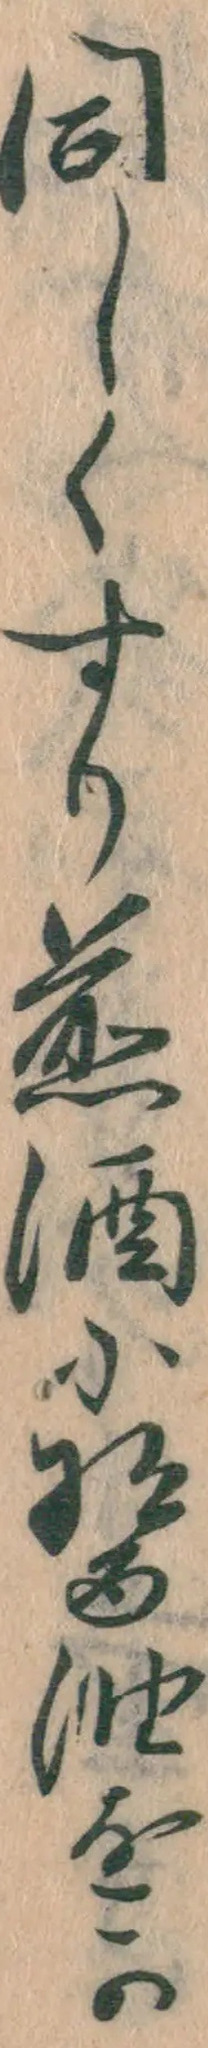同しくすり煎酒に醤油をか
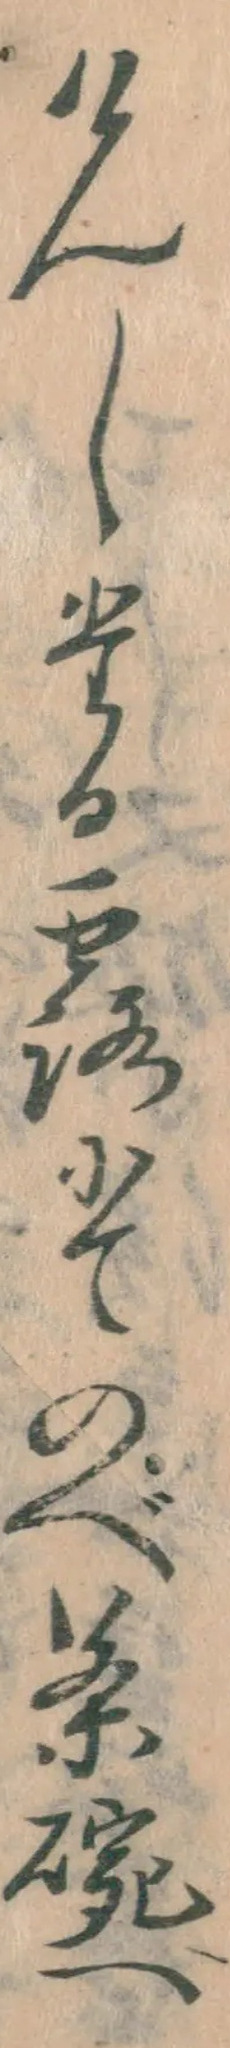けんしたる露にてのべ茶碗へ
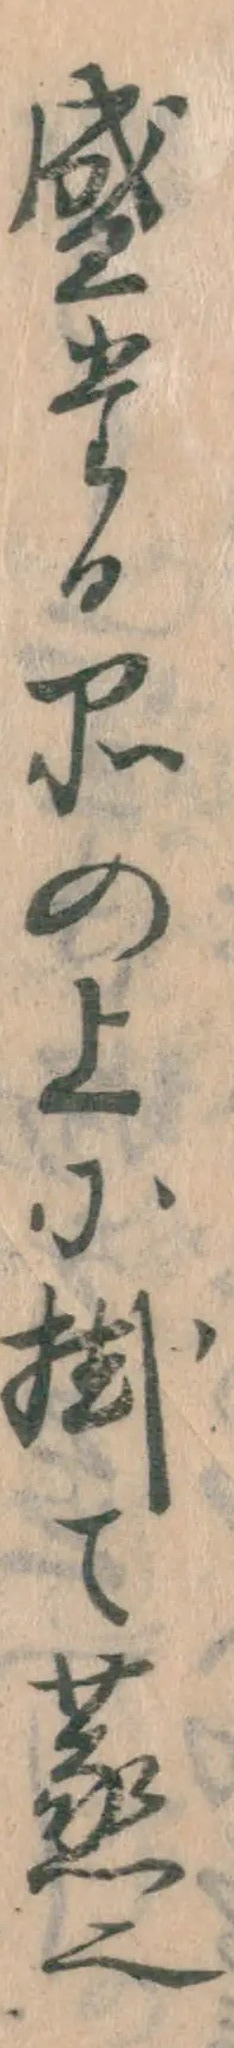盛たる品の上に掛て蒸也
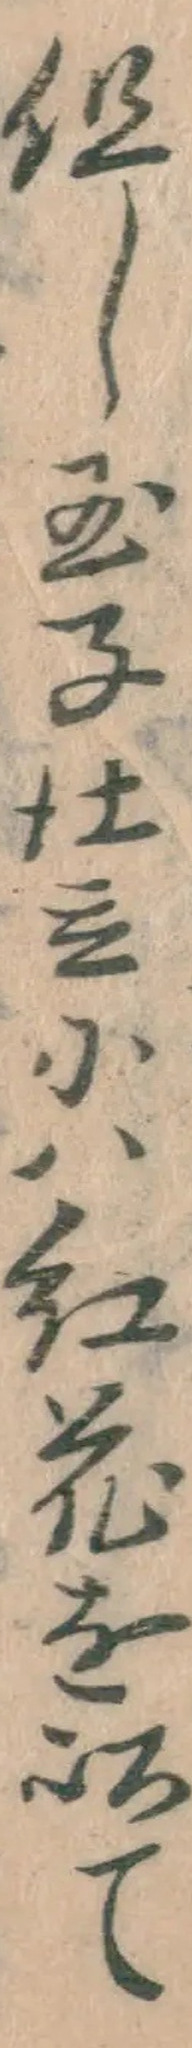但し玉子仕立には紅花を以て
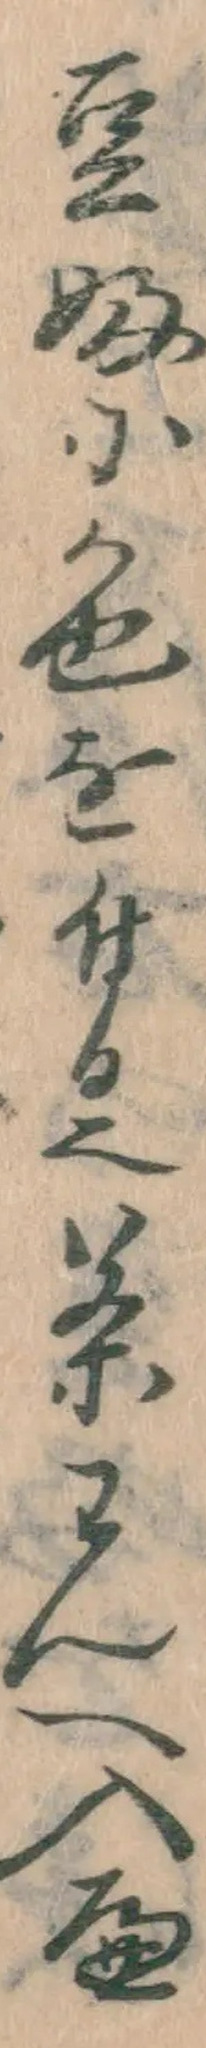豆ふに色を付る也茶わんへ入へ
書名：豆腐百珍余録
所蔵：国立国会図書館 National Diet Library, JAPAN
